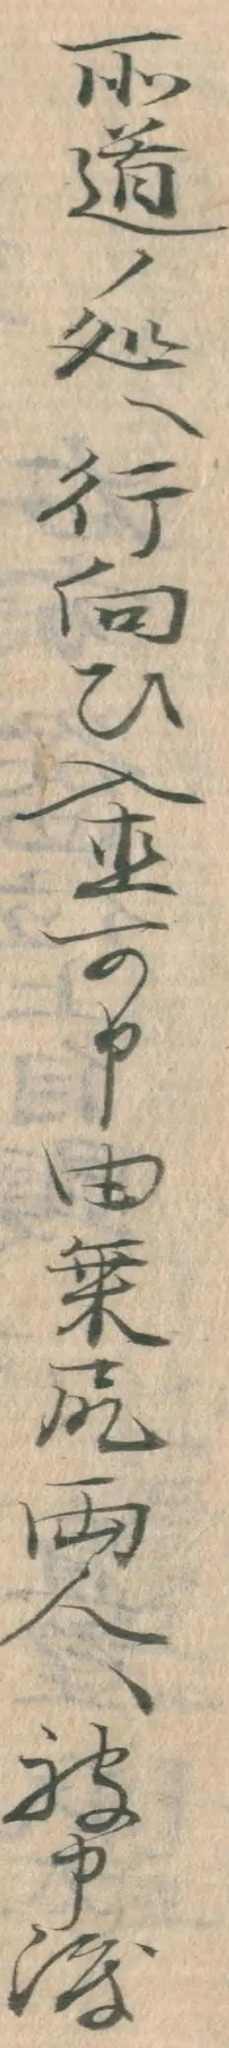所道ノ処へ行向ひ入直可申由乗尻両人へ被申渡
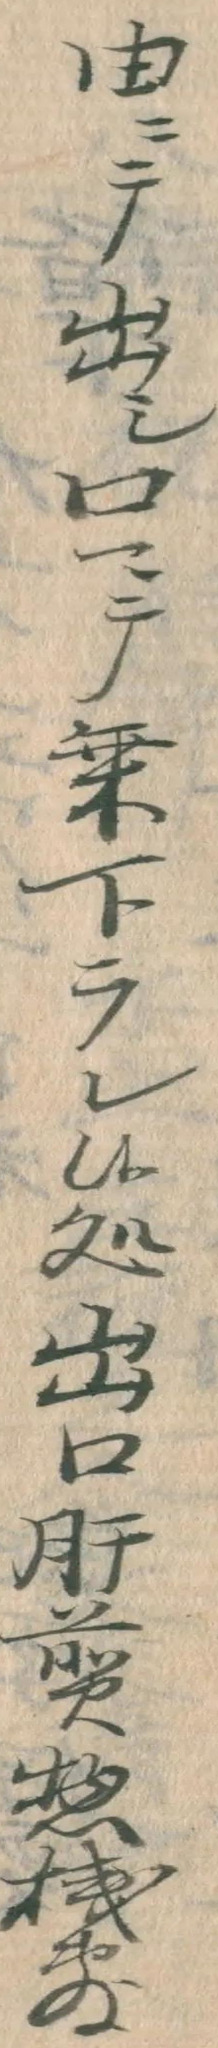由ニテ出シ口マテ乗下ラレ候処出口肝煎惣桟敷
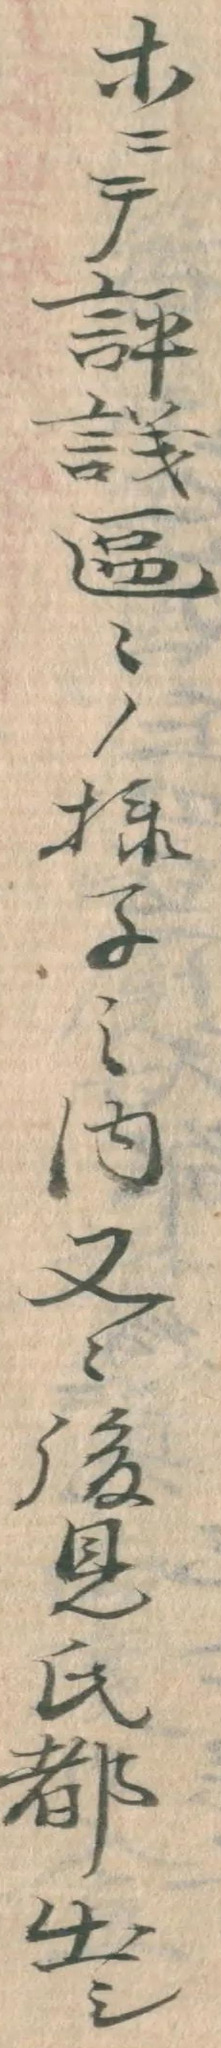等ニテ評議区々ノ様子之内又々後見氏都出シ
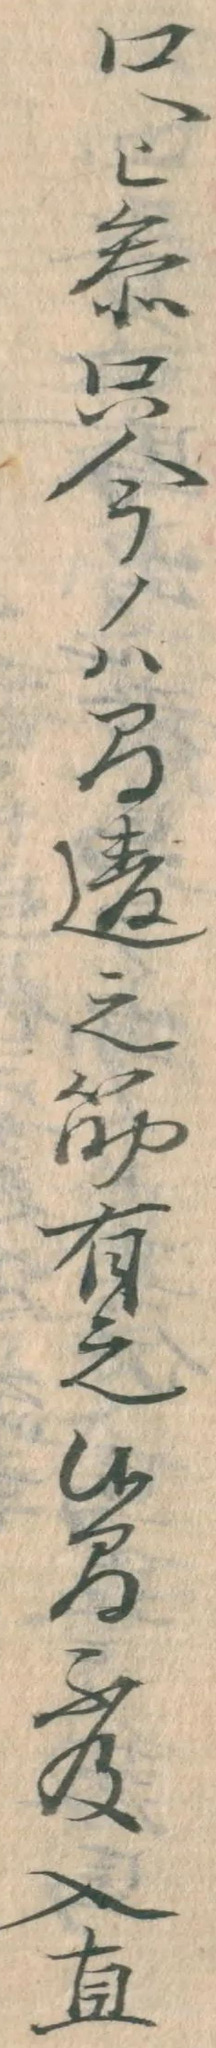口へ被参只今ノハ間違之筋有之候間不及入直
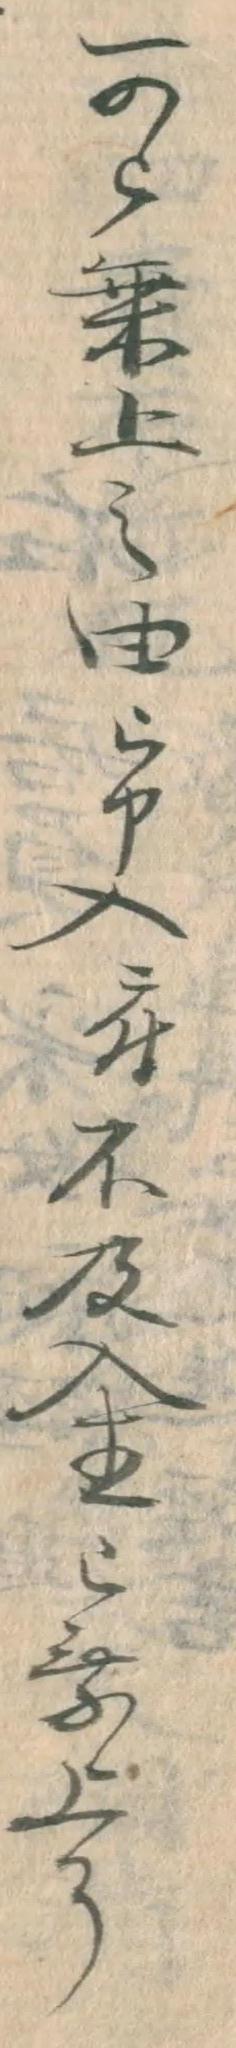可被乗上之由被申入ニ付不及入直被乗上了
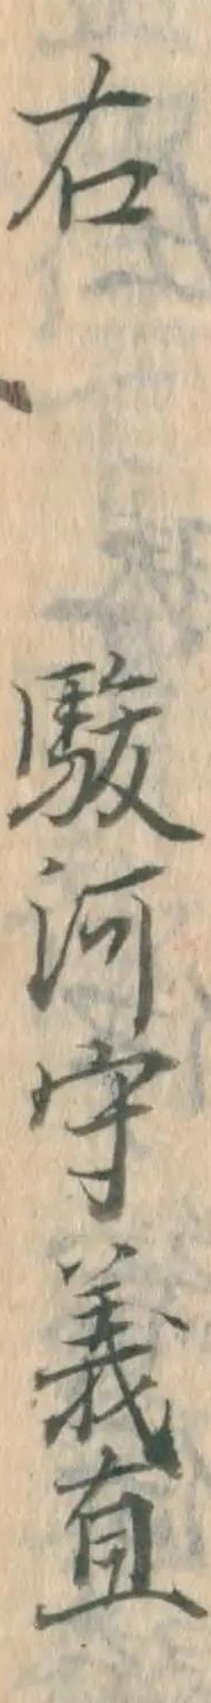右駿河守義直

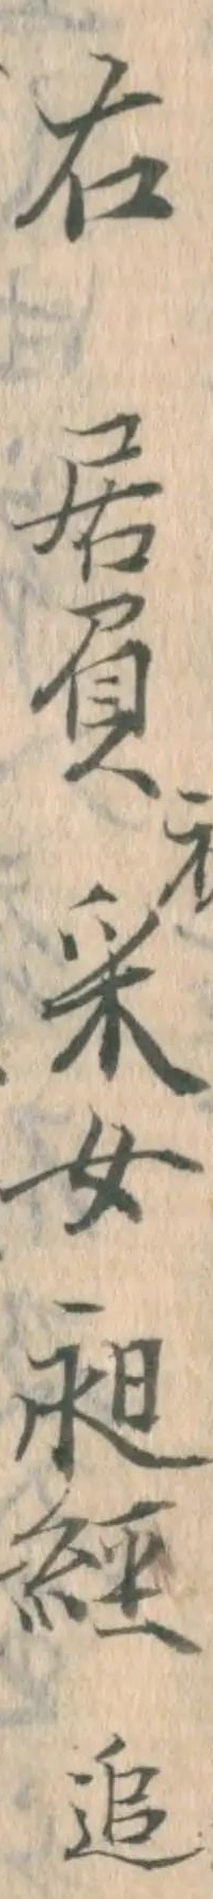右居負采女昶経追
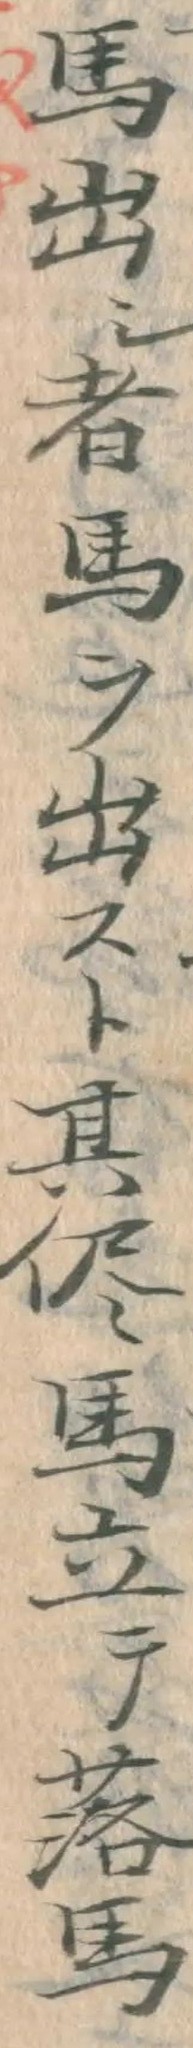(馬出シ者馬ヲ出スト其侭馬立テ落馬
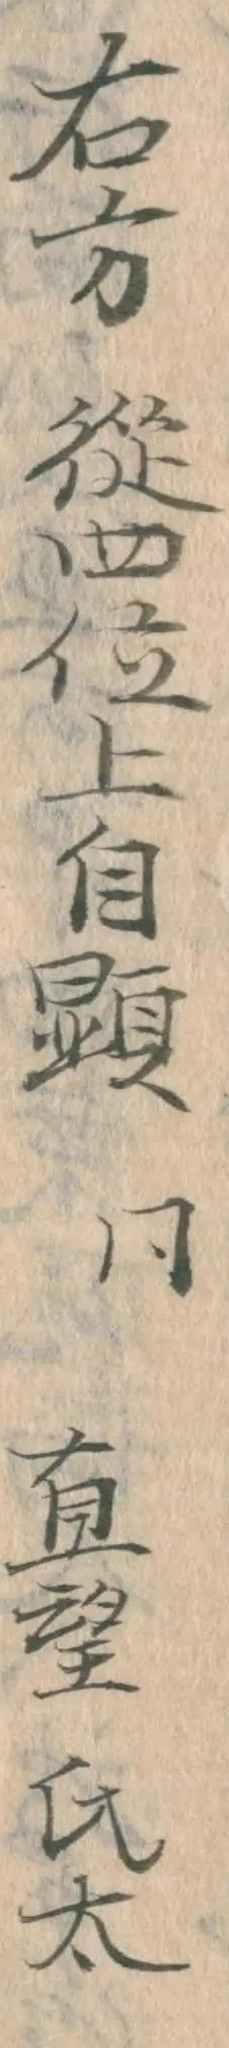右方従四位上自顕同直望氏太
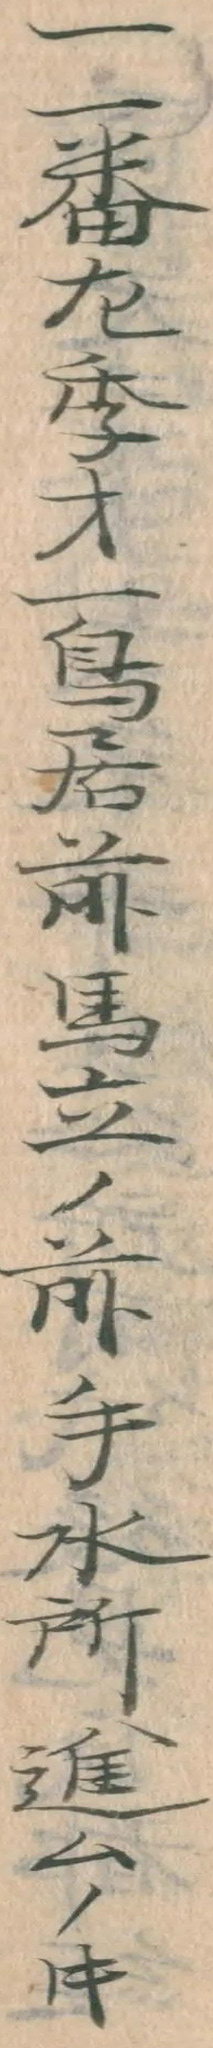一一番左季才一鳥居前馬立ノ前手水所へ進ムノトキ
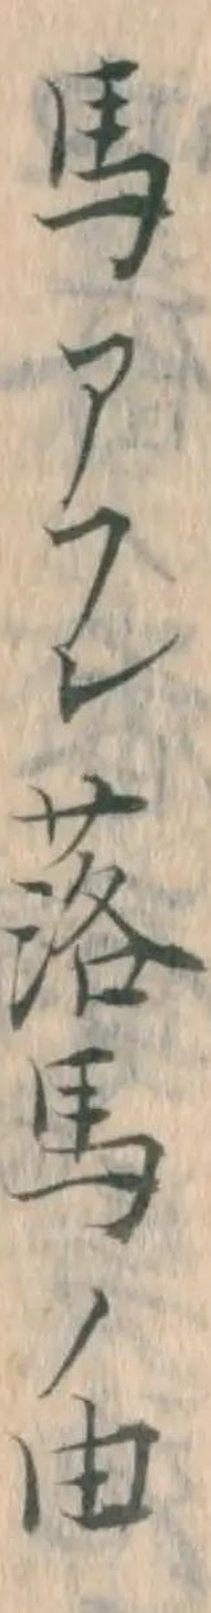馬アフレ落馬ノ由
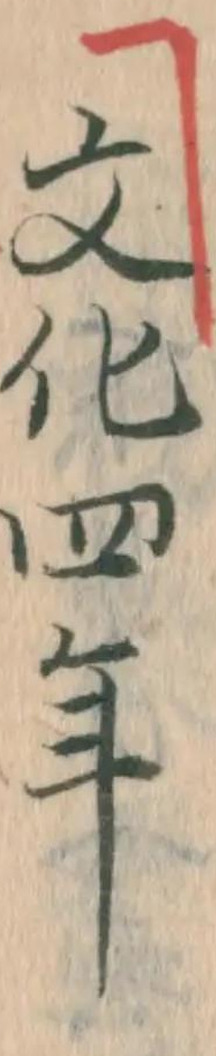文化四年
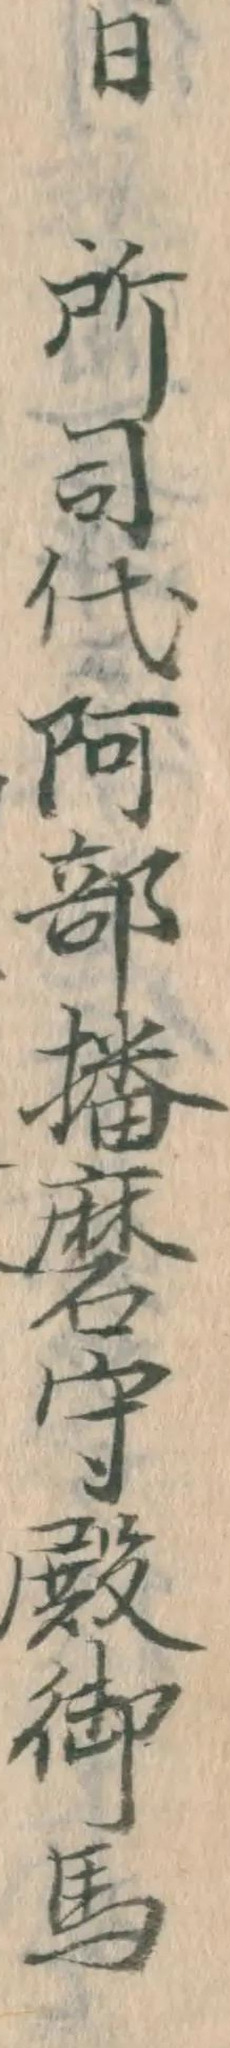朔日所司代阿部播磨守殿御馬
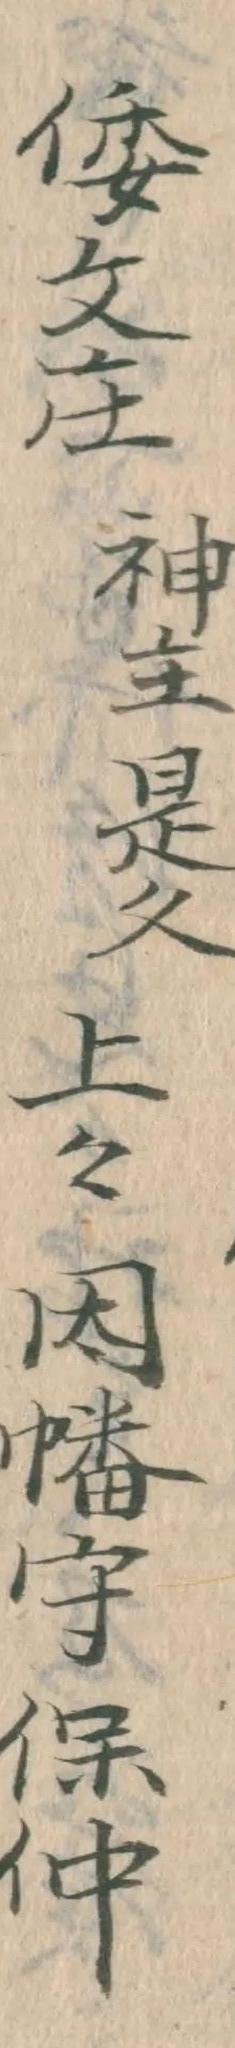倭文庄神主是久上々因幡守保仲
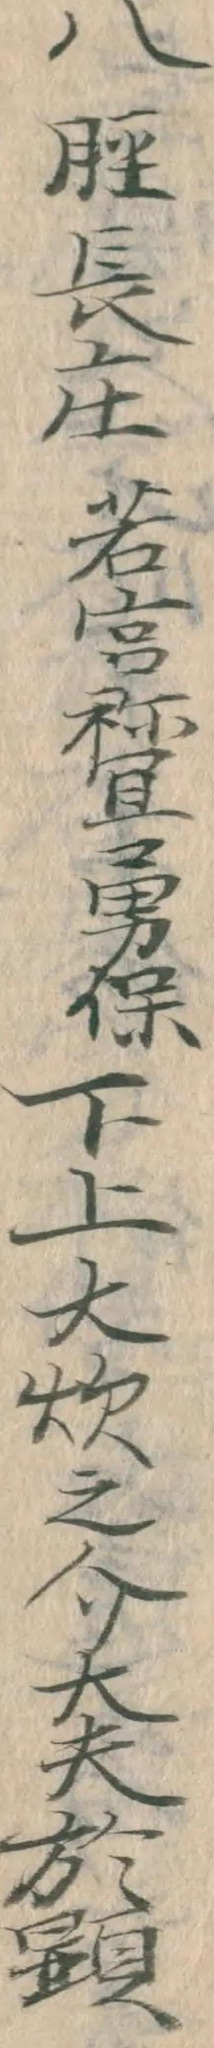八脛長庄若宮祢宜勇保下上大炊之介大夫於顕
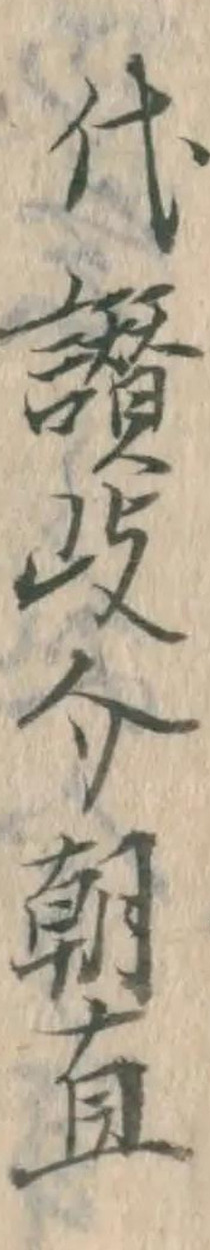代讃岐介朝直
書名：賀茂社記録. 第10冊
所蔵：国立国会図書館 National Diet Library, JAPAN
